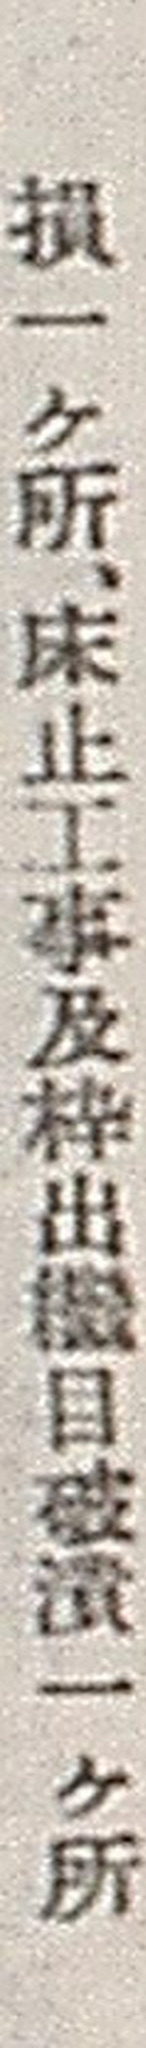損一ヶ所、床上工事及枠出目破潰一ヶ所
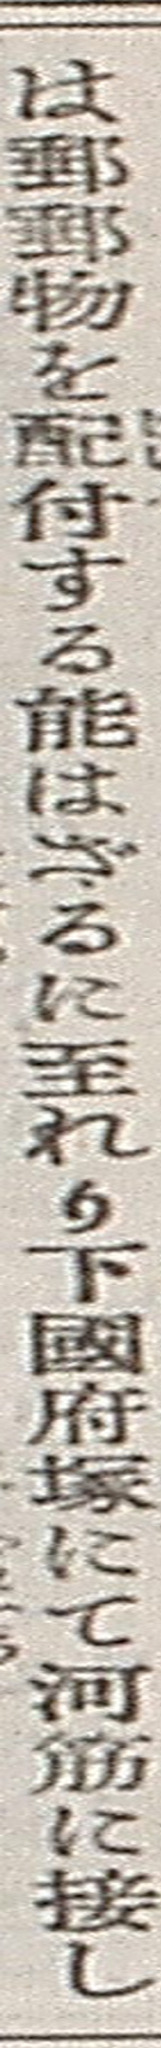は郵便物を配布する能はざるに至れり下国府塚にて河筋に接し
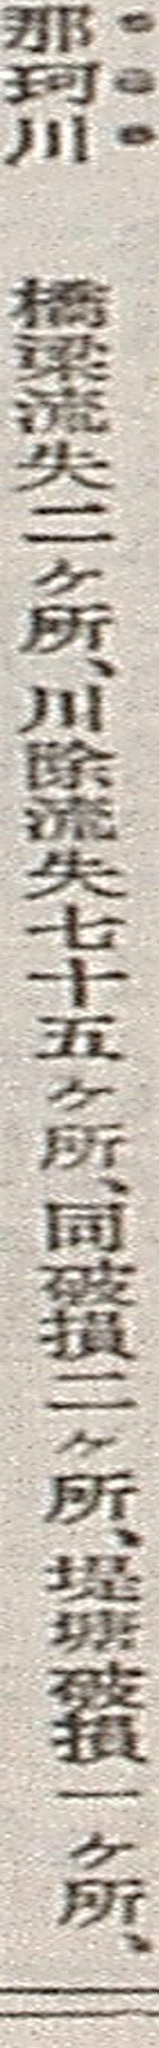那珂川橋梁流失二ヶ所、川除流失七十五ヶ所、同破損二ヶ所、堤塘破損一ヶ所
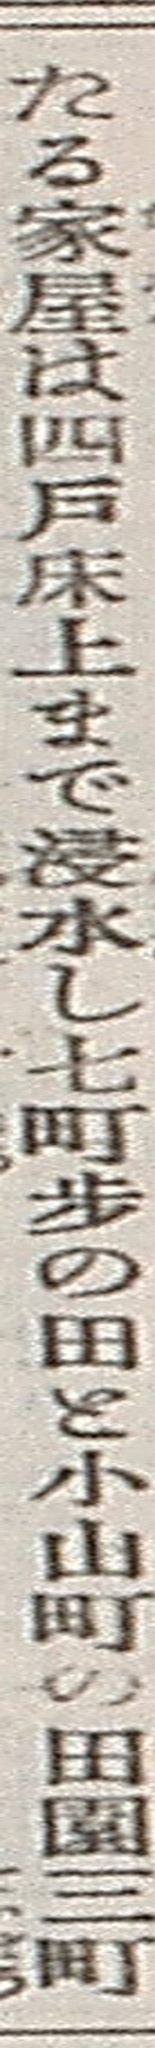たる家屋は四戸床上まで浸水し七町歩の田と小山町の田園三町
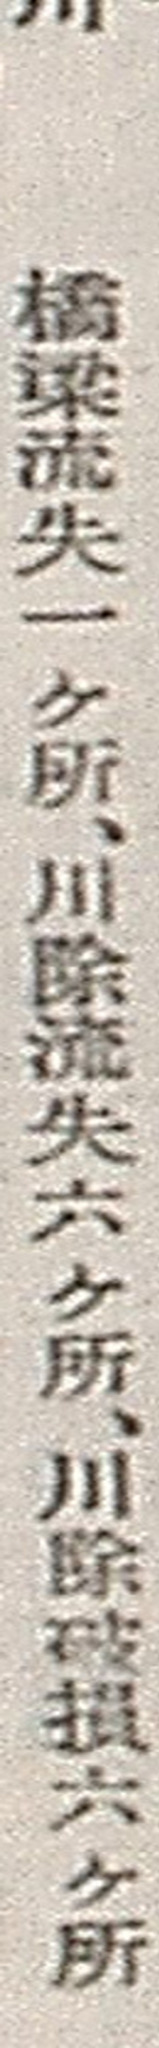箒川橋梁流失一ヶ所、川除流失六ヶ所、川除破損六ヶ所
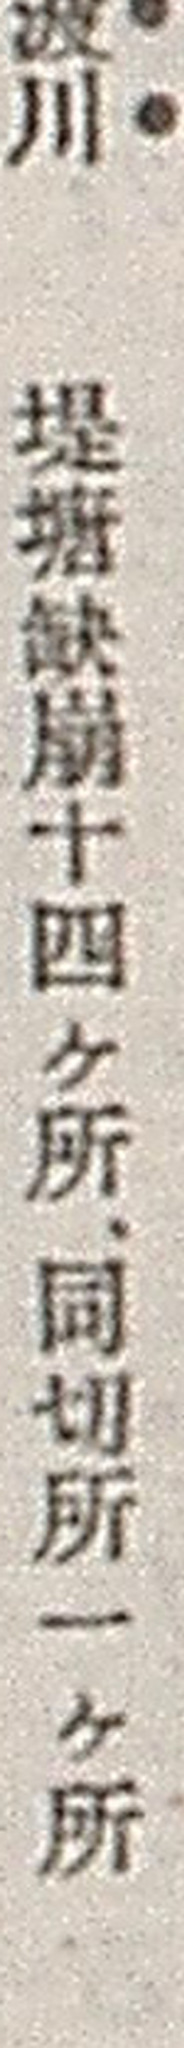巴波川堤塘缺崩十四ヶ所、同切所一ヶ所
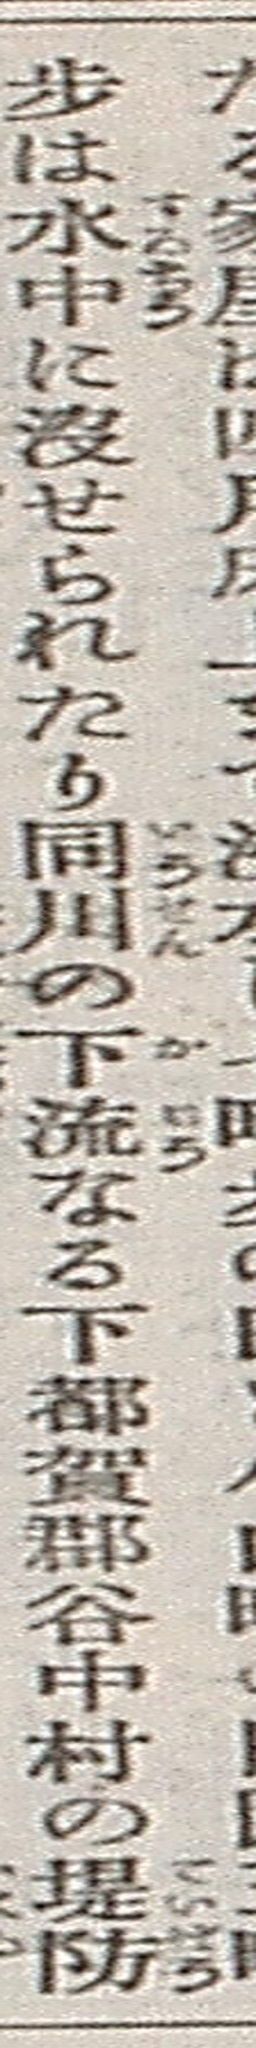歩は水中に没せられたり同川の下流なる下都賀郡谷中村の堤防
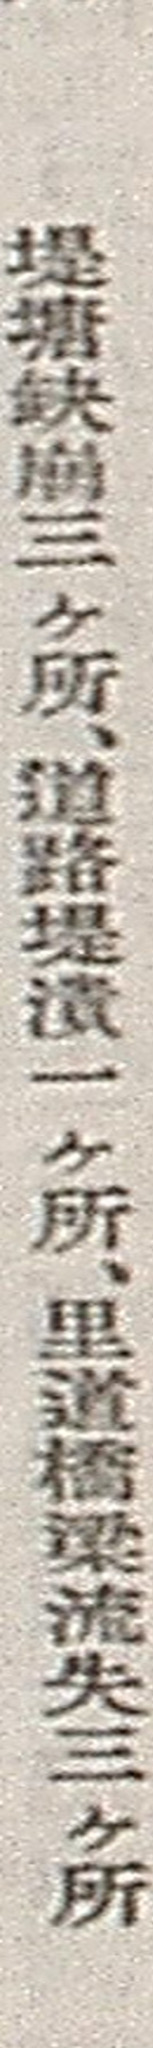思川堤塘缺崩三ヶ所、道路堤潰一ヶ所、里道橋梁流失三ヶ所
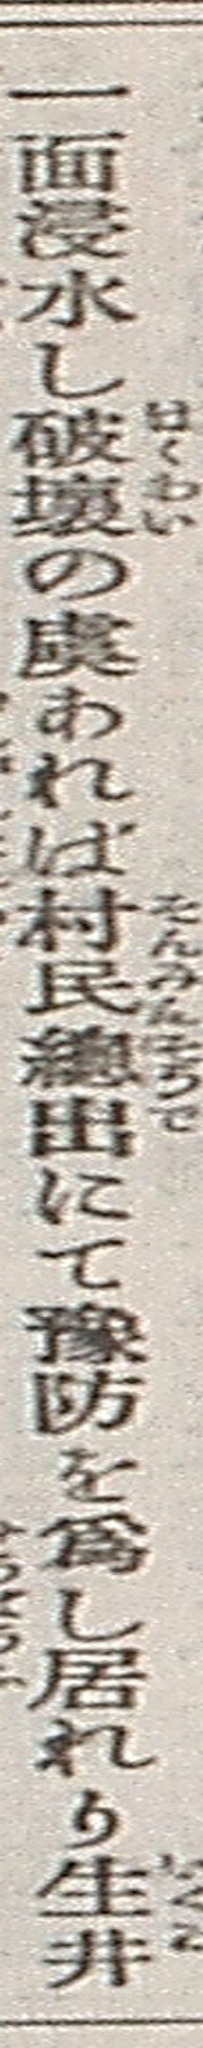一面浸水し破壊の虞あれば村民総出にて予防を為し居れり生井
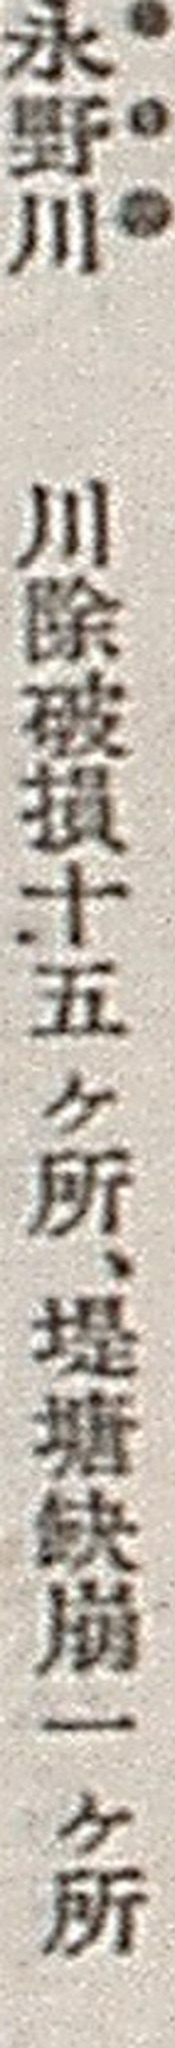永野川川除破損十五ヶ所、堤塘缺崩一ヶ所
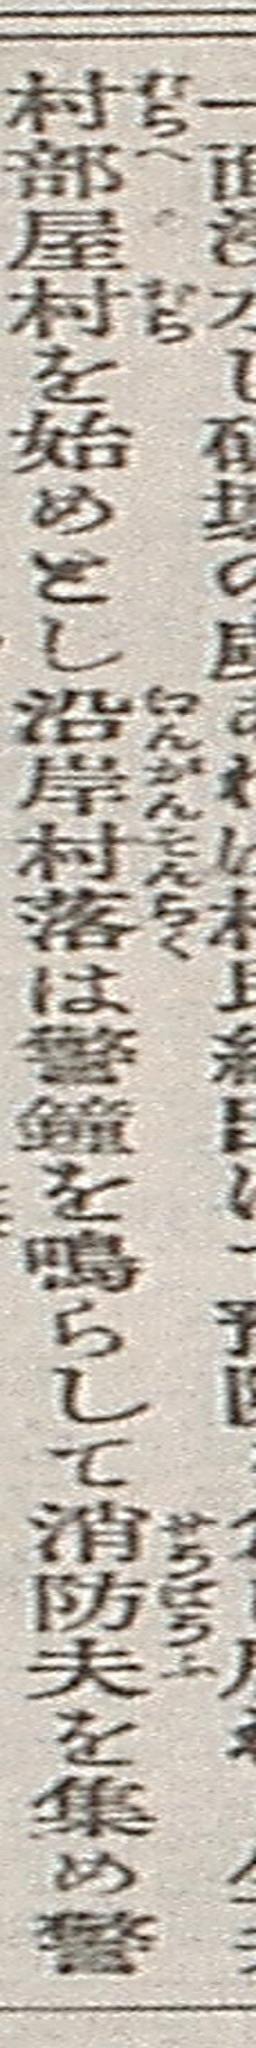村部屋村を始めとし沿岸村落は警鐘を鳴らして消防夫を集め警
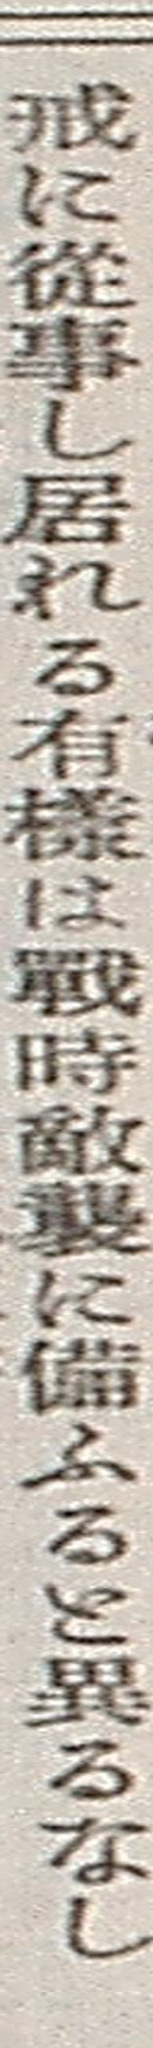戒に従事し居れる有様は戦時敵襲に備ふると異るなし
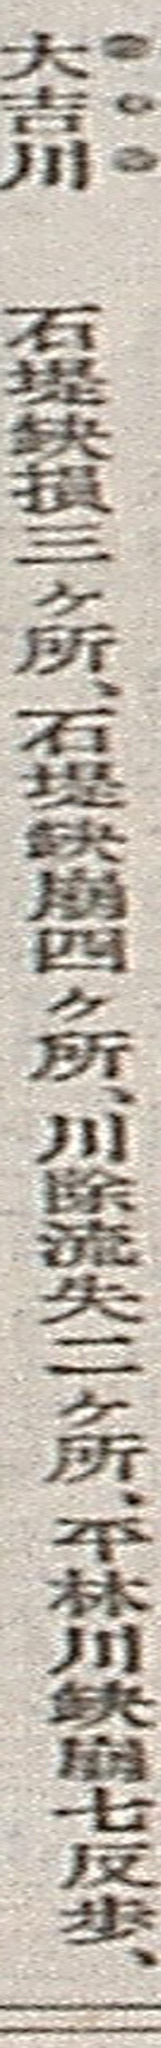大吉川石提缺損三ヶ所、石提缺崩四ヶ所、川除流失二ヶ所、平林川缺崩七反歩、
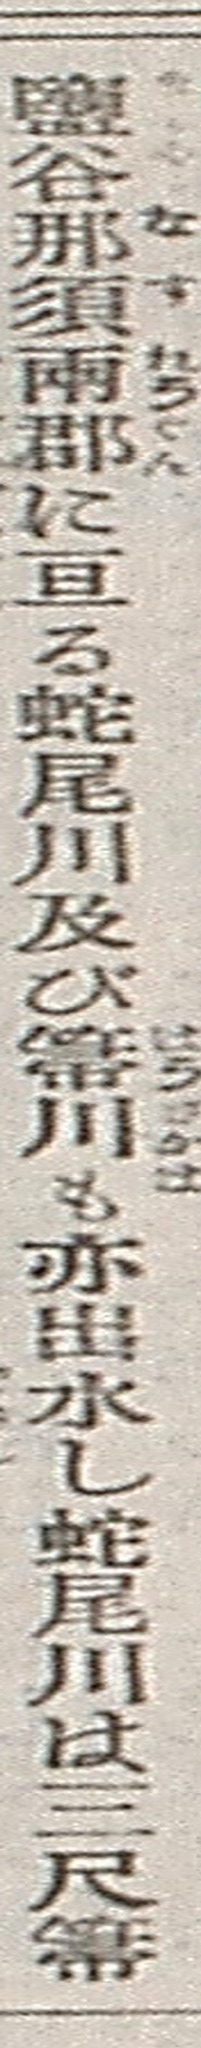鹽谷那須両郡に亘る蛇尾川及び箒川も亦出水し蛇尾川は三尺箒
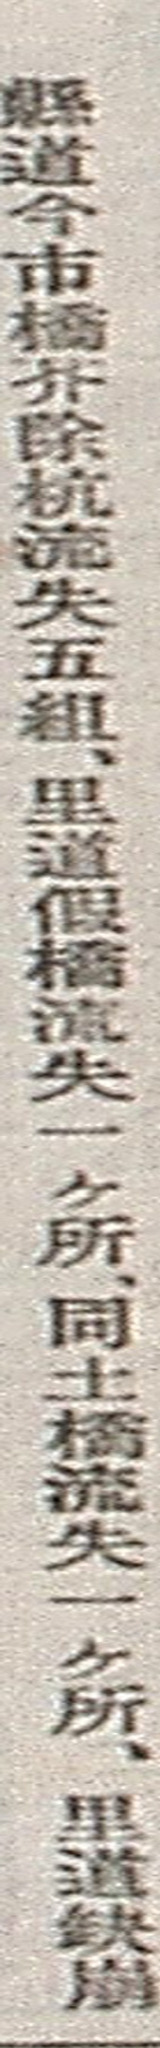県道今市橋芥除杭流失五組、里道假橋流失一ヶ所、同土橋流失一ヶ所、里道缺崩
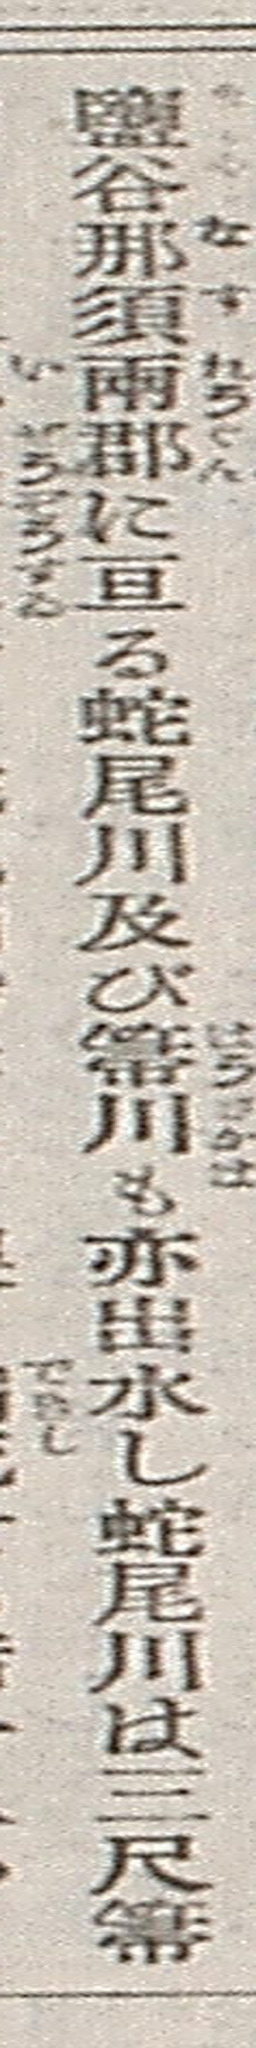鹽谷那須両郡に亘る蛇尾川及び箒川も亦出水し蛇尾川は三尺箒
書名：風俗畫報臨時増刊第百二十八號　洪水被害録（下）
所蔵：東京大学地震研究所図書室 Earthquake Research Institute Library, The University of Tokyo, JAPAN
